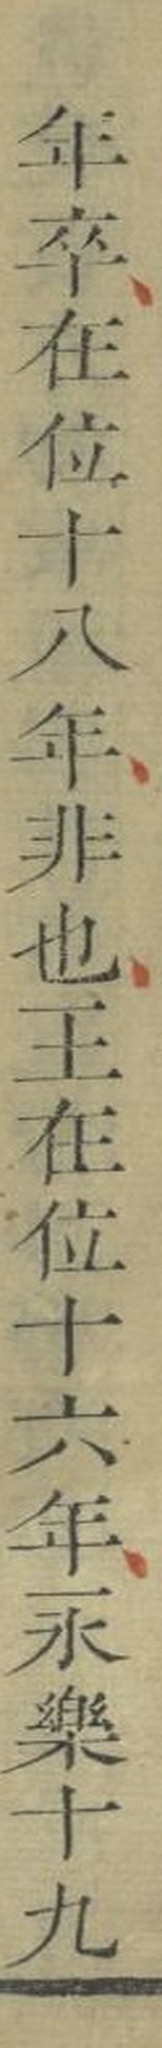年卒在位十八年非也王在位十六年永楽十九
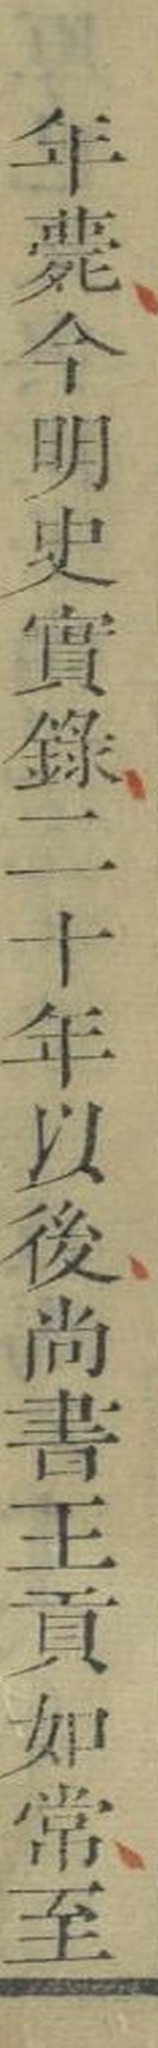年薨今明史実録二十年以後尚書王貢如常至
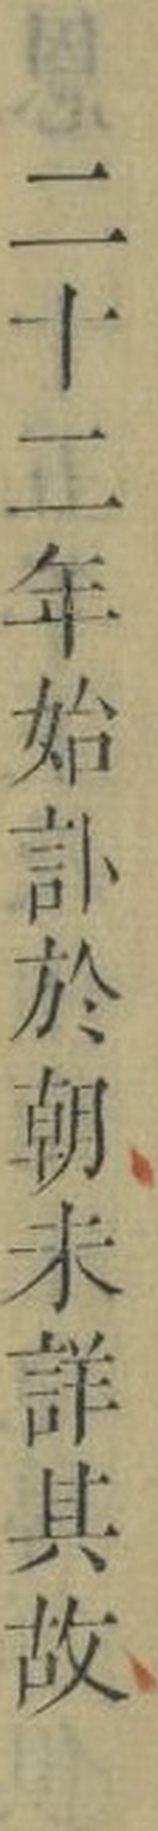二十二年始訃於朝未詳其故
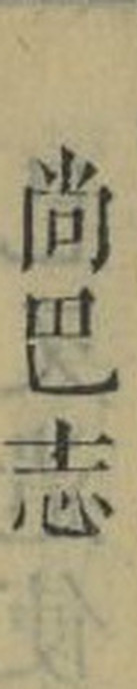尚巴志
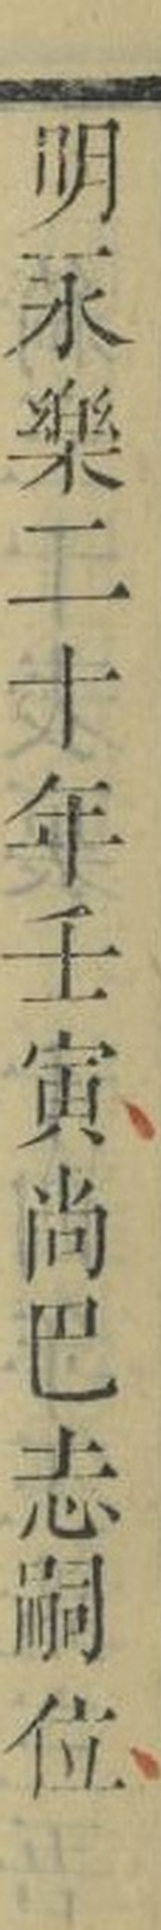明永楽二十年壬寅尚巴志嗣位
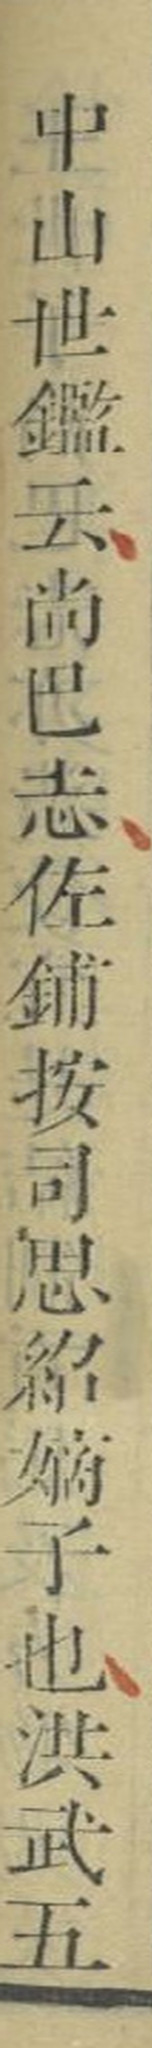中山世鑑云尚巴志佐鋪按司思紹嫡子也洪武五
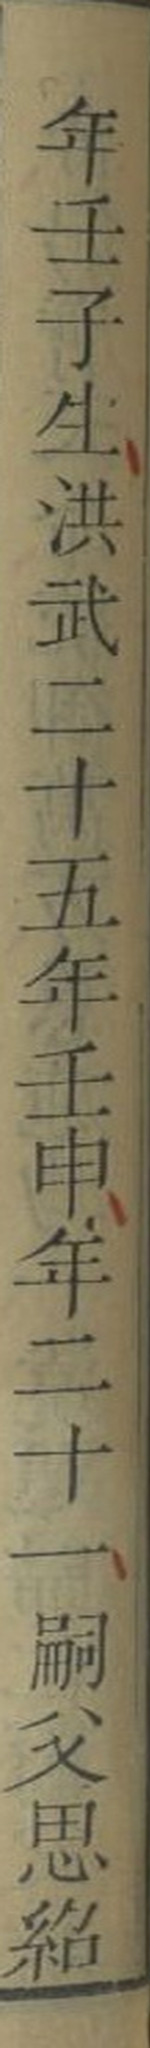年壬子生洪武二十五年壬申年二十一嗣父思紹
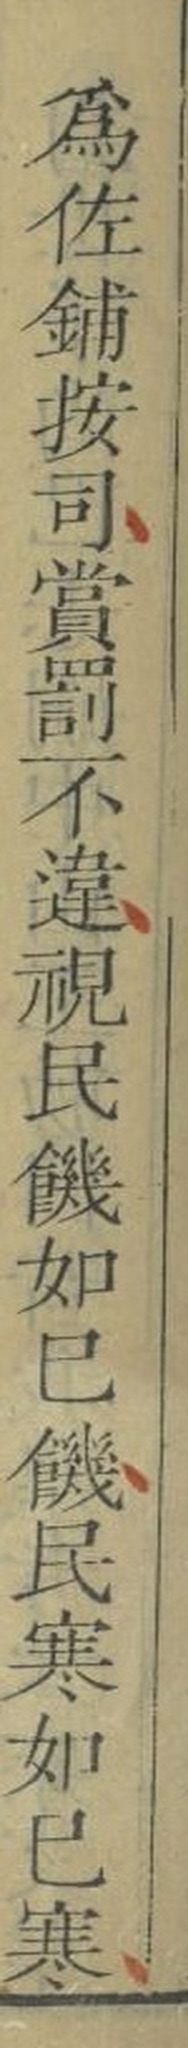為佐鋪按司賞罰不違視民饑如巳饑民寒如巳寒
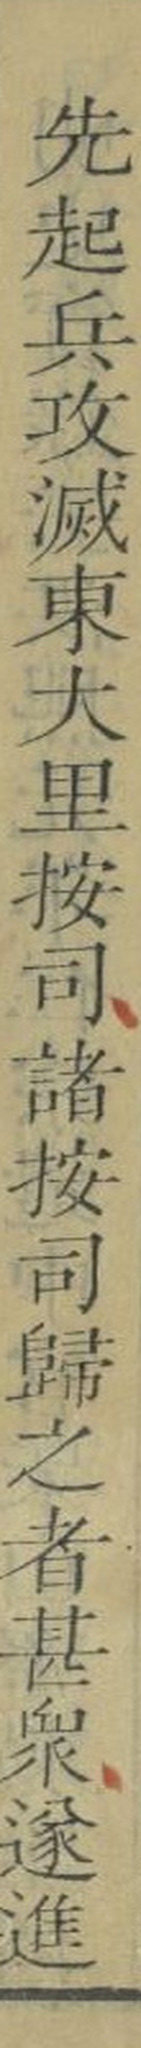先起兵攻滅東大里按司諸按司帰之者甚衆遂進
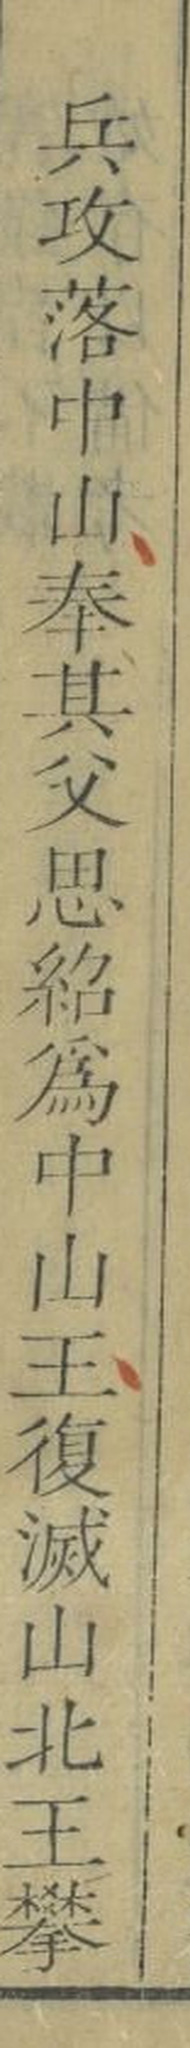兵攻落中山奉其父思紹為中山王復滅山北王攀
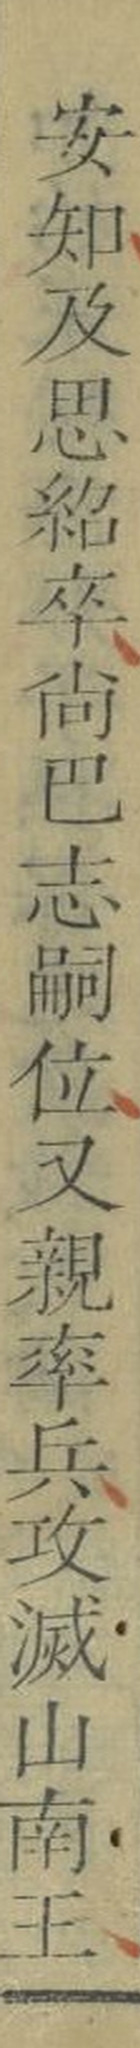安知及思紹卒尚巴志嗣位又親率兵攻滅山南王
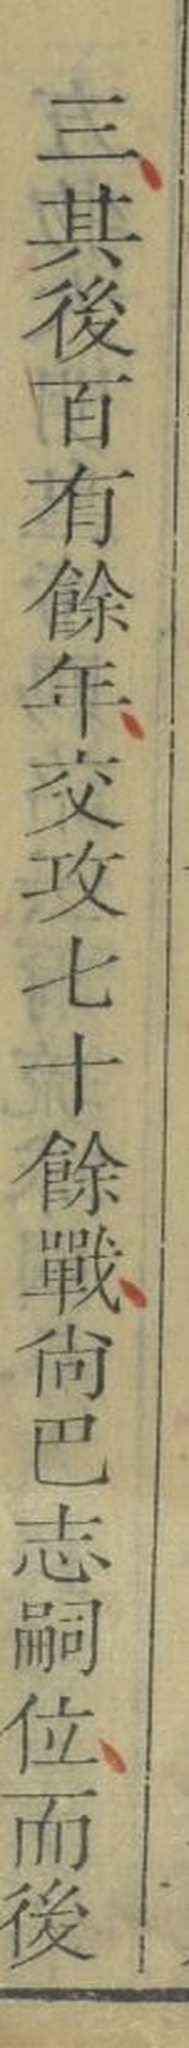三其後百有余年交攻七十余戦尚巴志嗣位而後
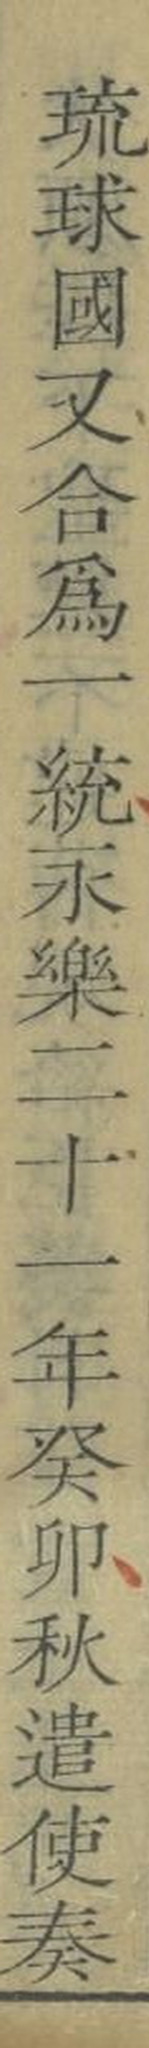琉球国又合為一統永楽二十一年癸卯秋遣使奏
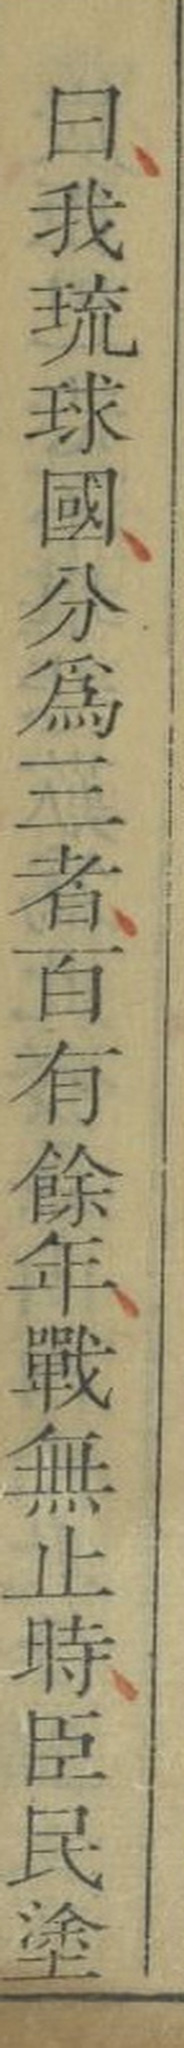曰我琉球国分為三者百有余年戦無止時臣民塗

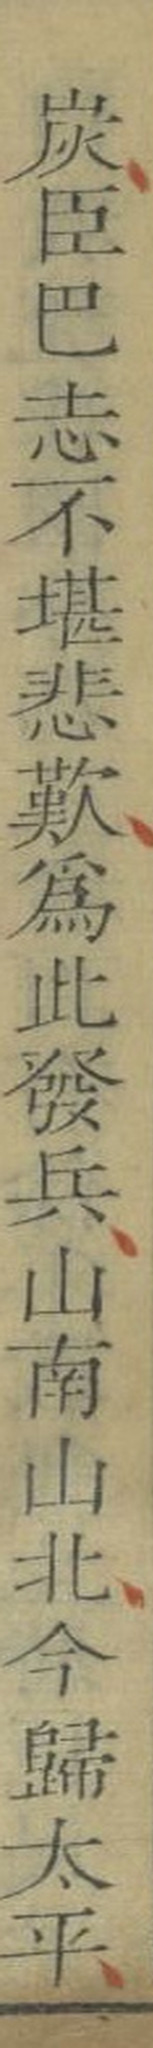炭臣巴志不堪悲歎為此発兵山南山北今帰太平
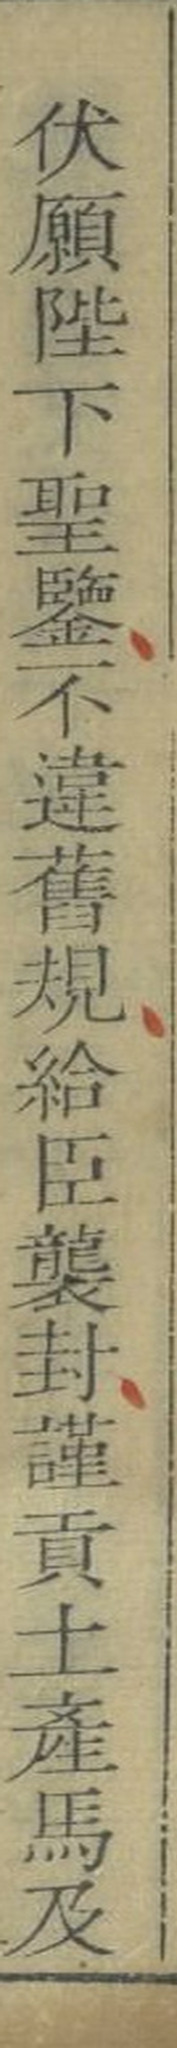伏願陛下聖鑑不違旧規給臣襲封謹貢土産馬及
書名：中山伝信録 巻三
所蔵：University of the Ryukyus Library
